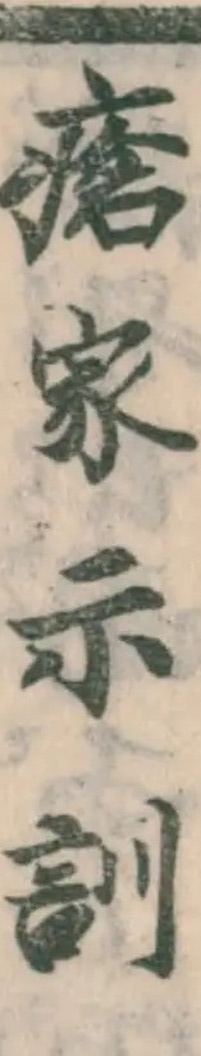瘡家示訓
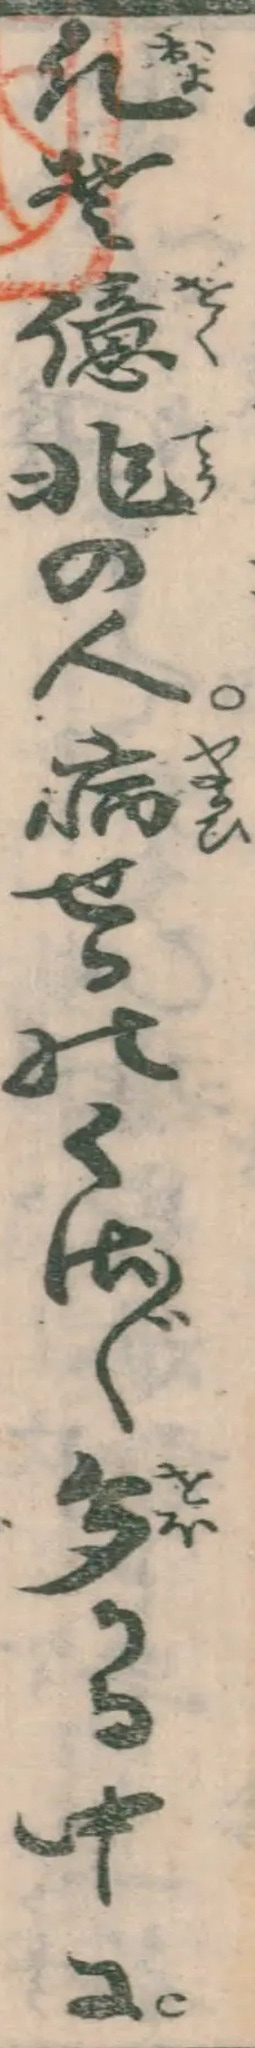凢そ億兆の人。病せるのくさ〴〵多かる中に。
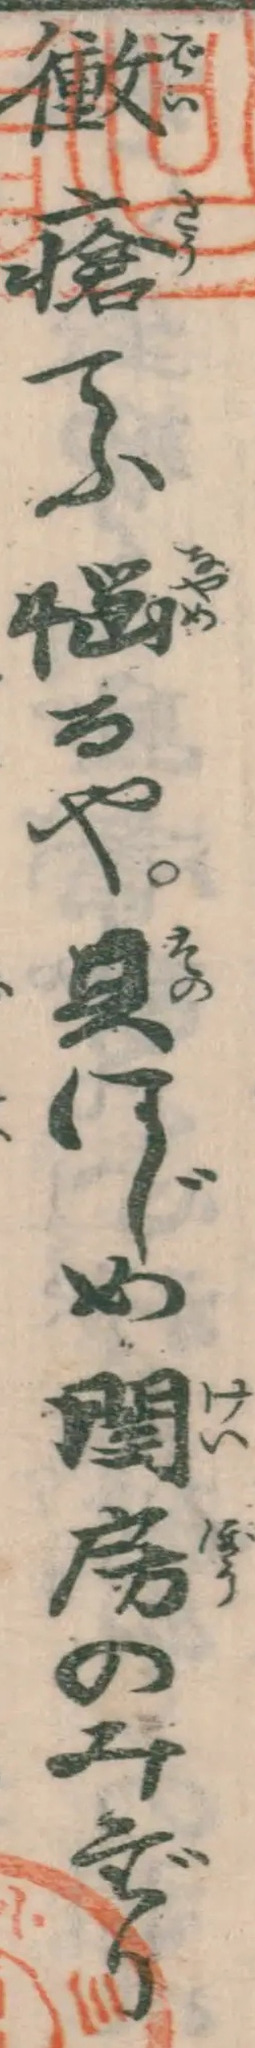黴瘡てふ悩るや。其はじめ閨房のみぞり
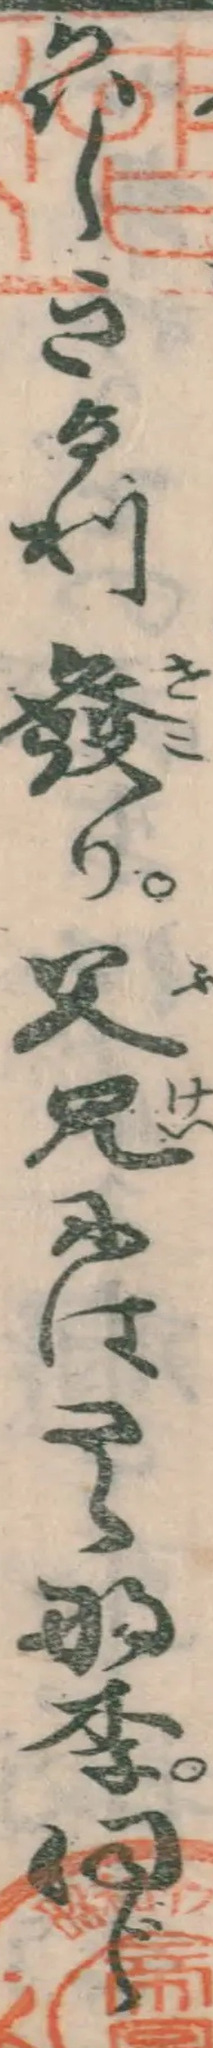かはしきる利發り。父兄にはすたゝなり。同じ
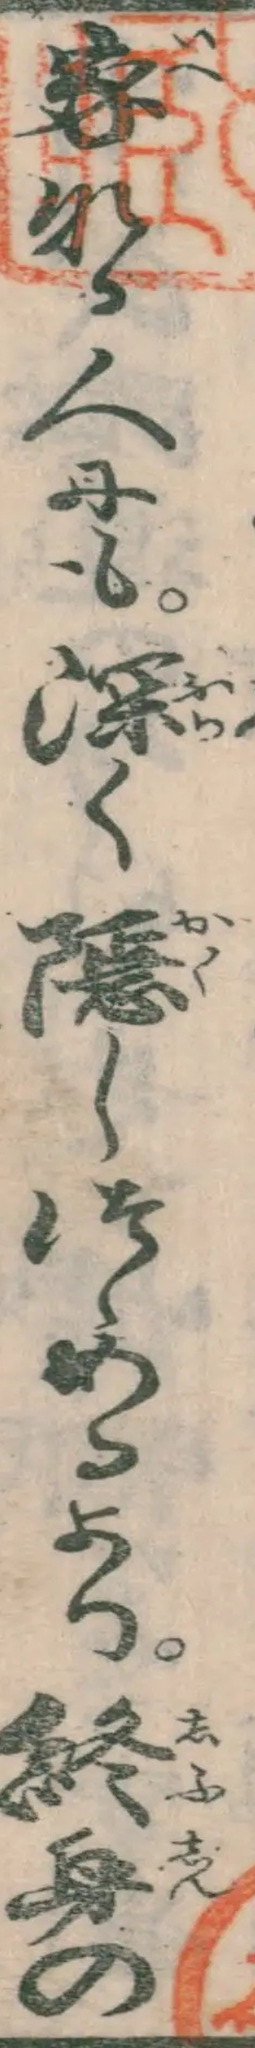家なる人にも。深く隠しつめるゝより。終身の
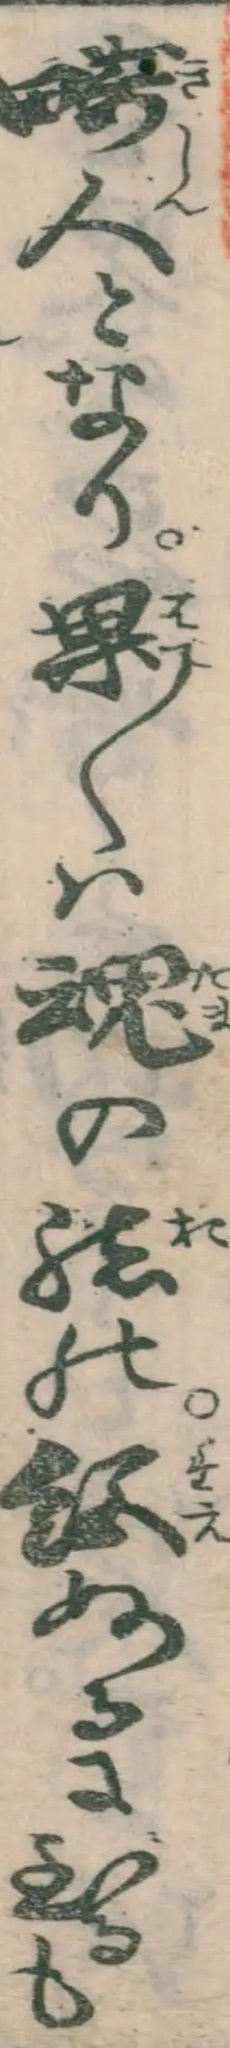奇人となり。果〳〵は魂の張の。飯ぬるに至るも
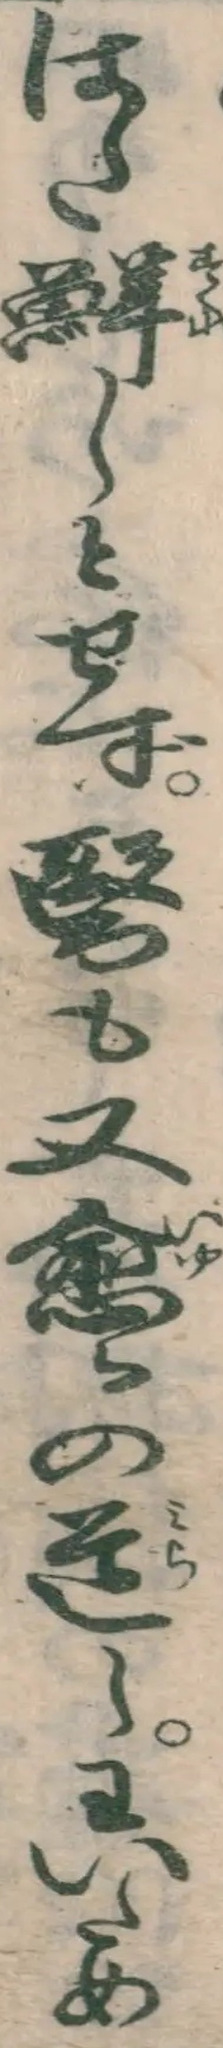はた鮮しとせず。醫又愈々の道し。わいため

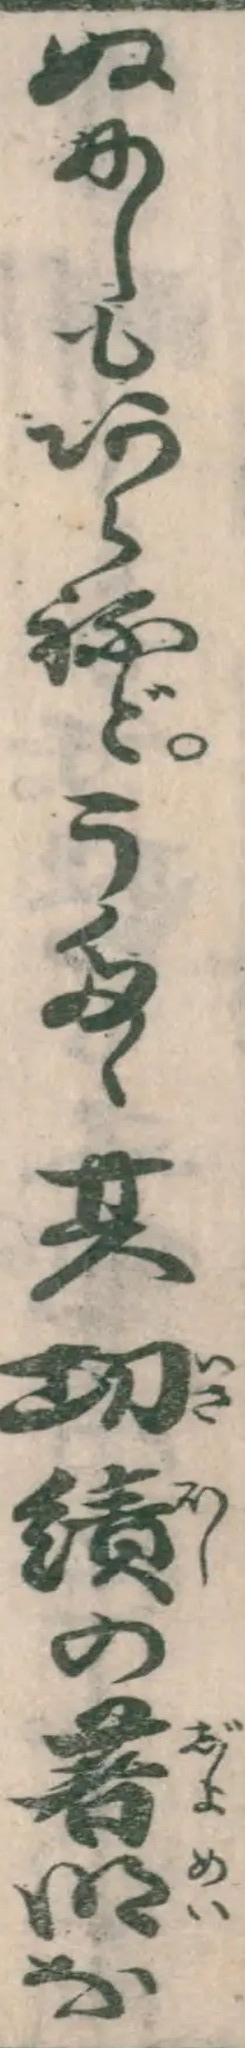ぬにしもあらあずど。うたゝ其功績の著明な
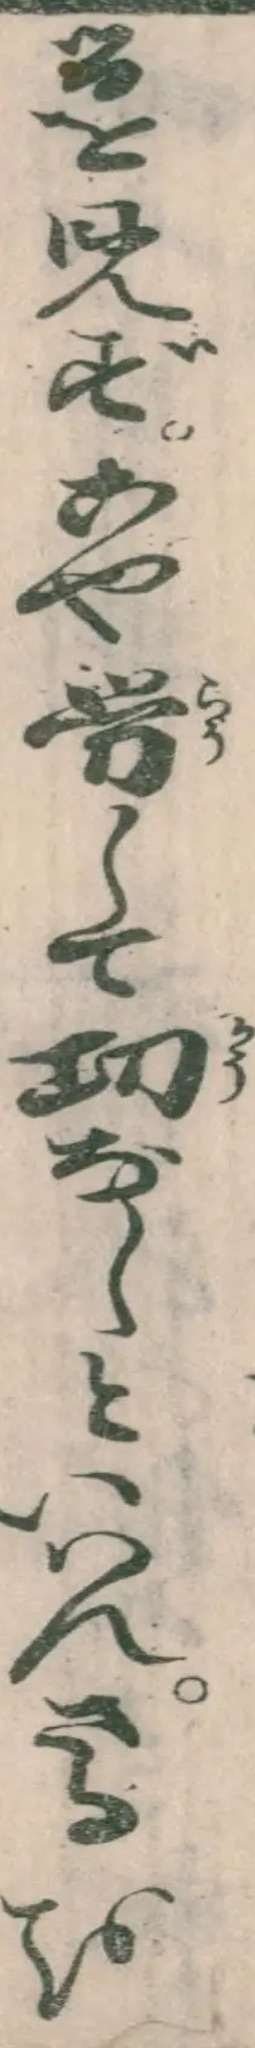るを見ず。こや労して功なしといはん。さるを
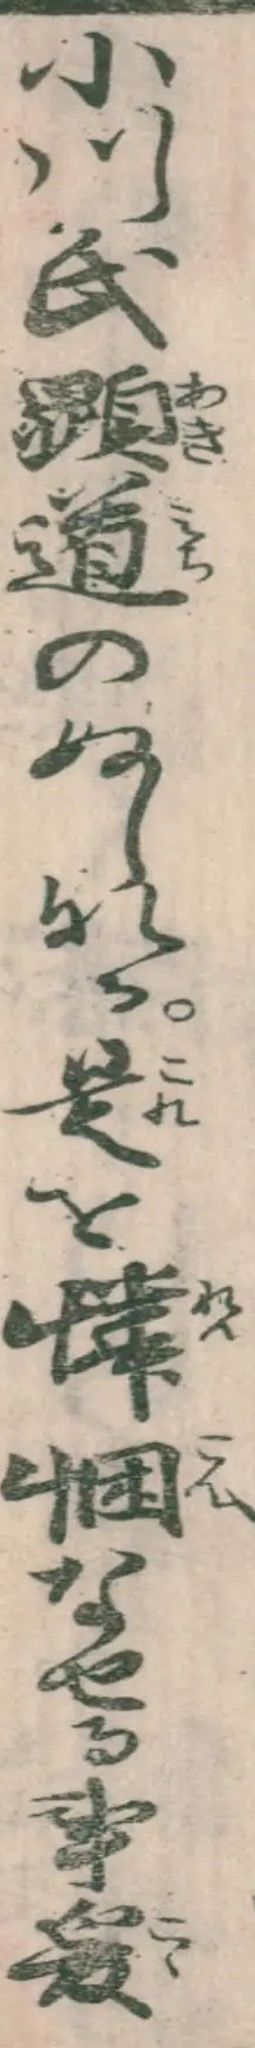小川氏顕道のぬしなゝ。是を憐悃なせる事爰
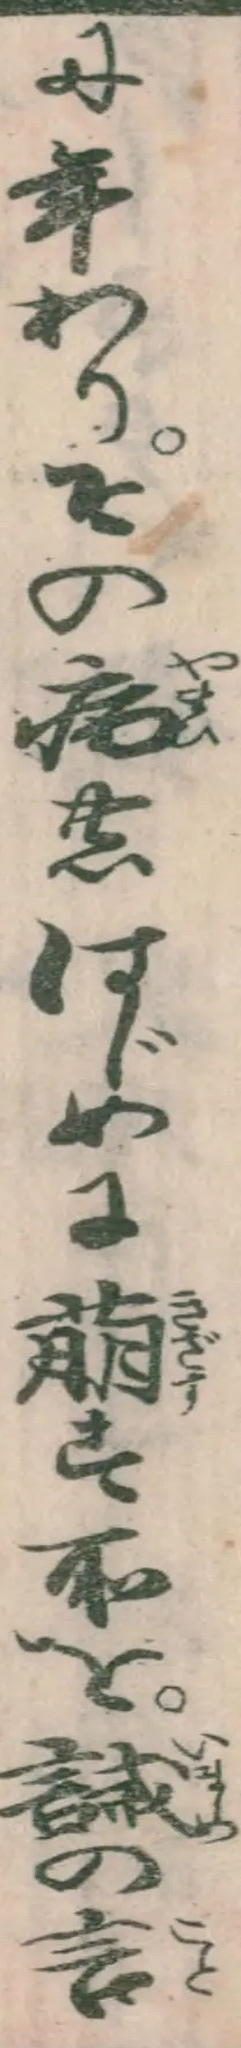に年わり。その病しはじめに萌す所を。誡の言
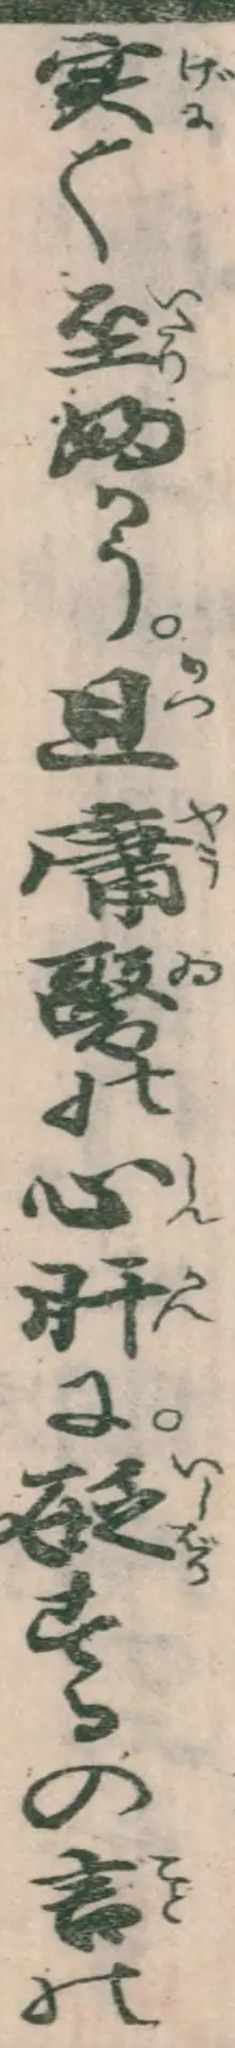実〳〵至ふかう。旦庸醫心肝に。延するの言の
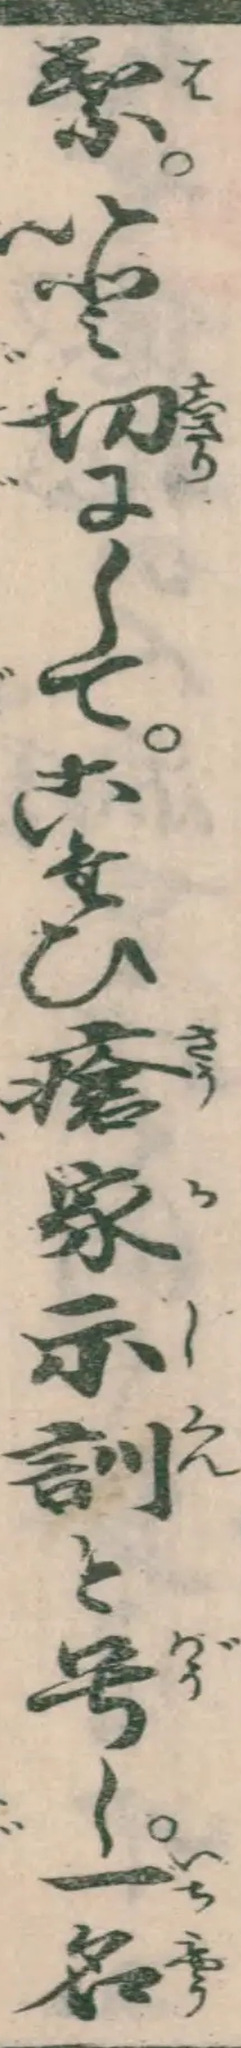葉。いと切にして。こせひ瘡家示訓と号し。一名
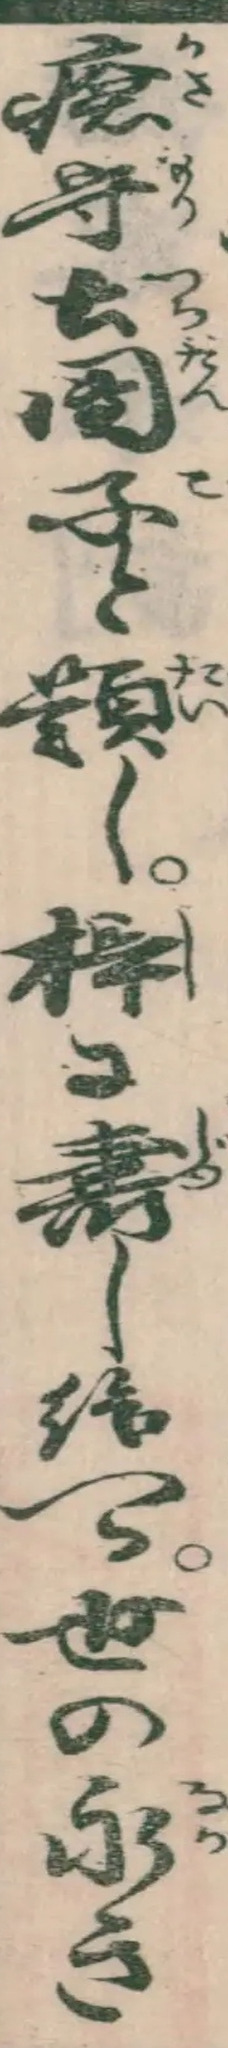瘡守土団子と題し。梓に壽し佛いる。世の永き
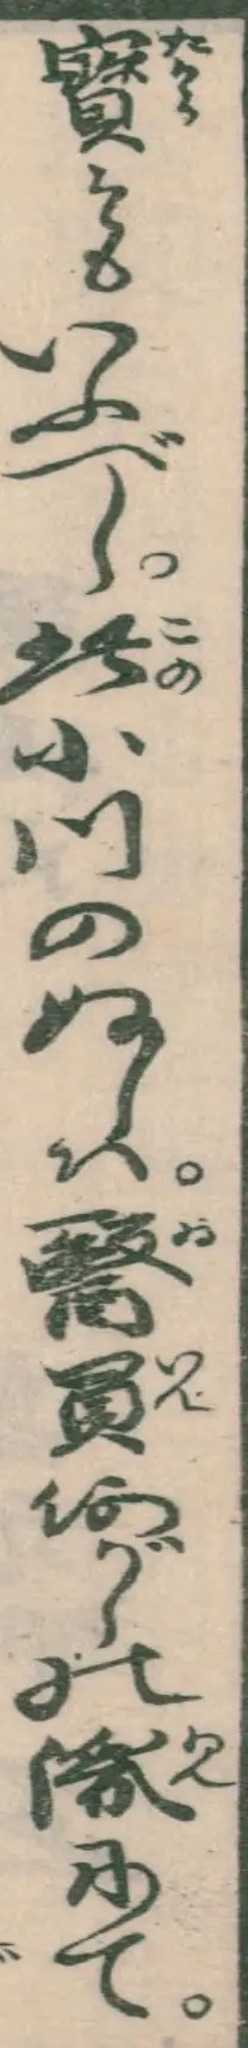寳ともいふべし。此小川のぬしは。醫員何がしのにて。
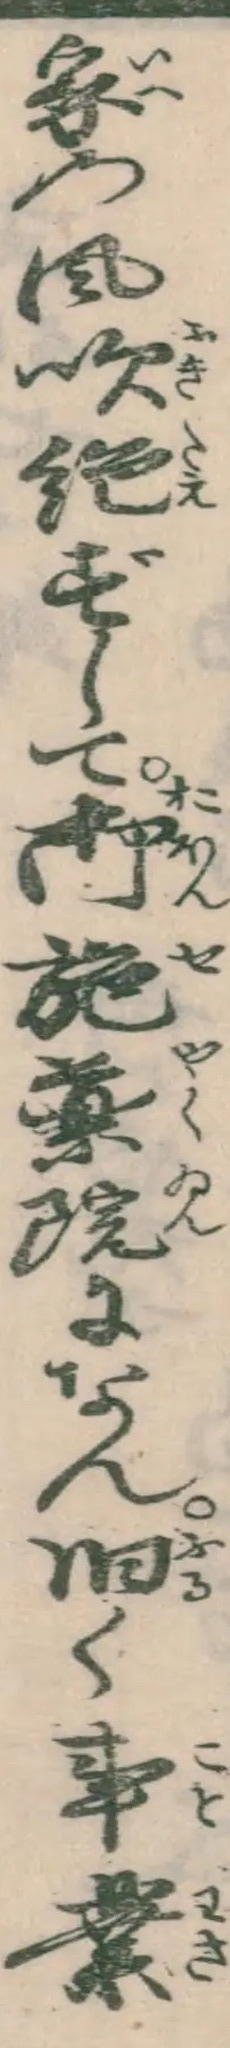家つ風吹絶ずして。御施薬院になん。旧く事業
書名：瘡家示訓
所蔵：国立国会図書館 National Diet Library, JAPAN
